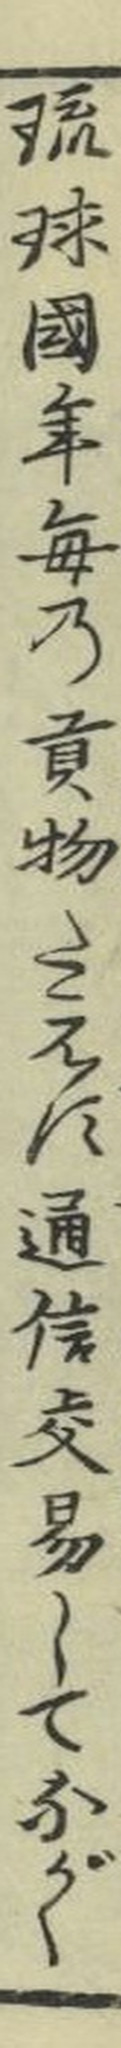琉球国年毎の貢物たえず、通信交易してながく
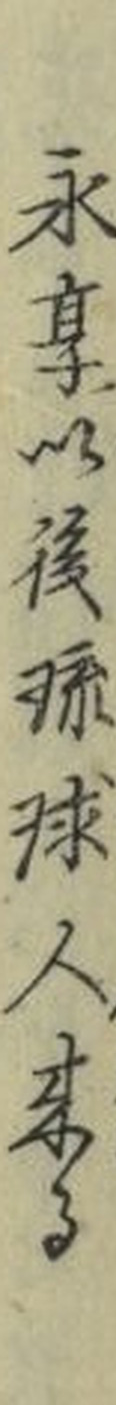永享以後琉球人来る
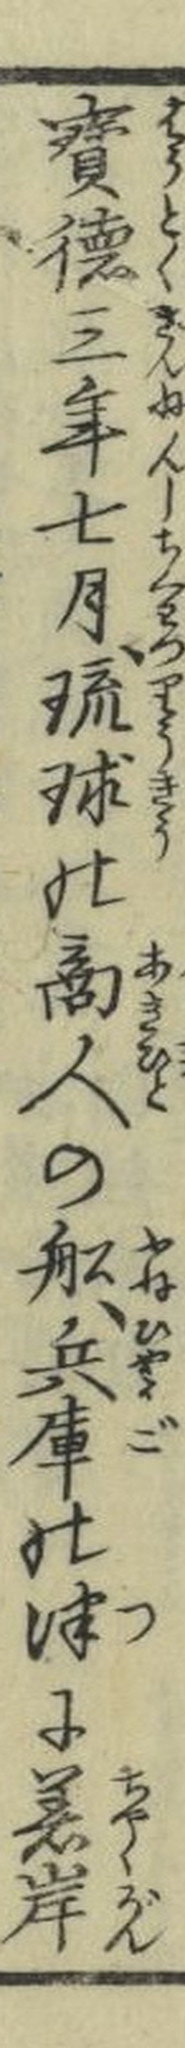宝徳三年七月、琉球の商人の船、兵庫の津に着岸
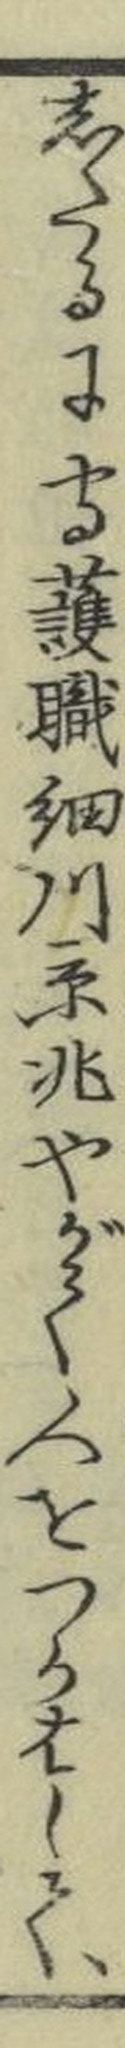したるに、守護職細川京兆やがて人をつかはして、
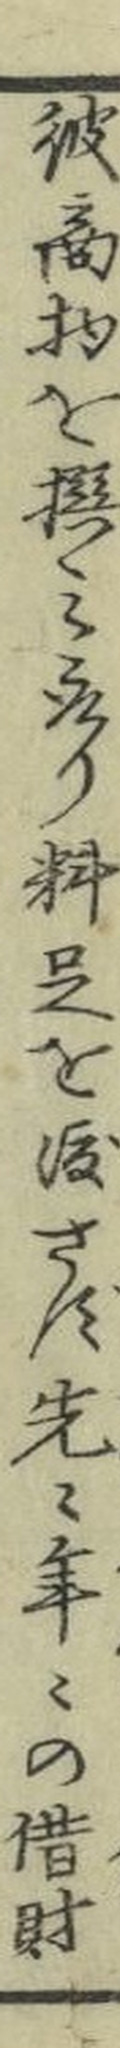彼商物を撰み取り料足を渡さず、先々年々の借財
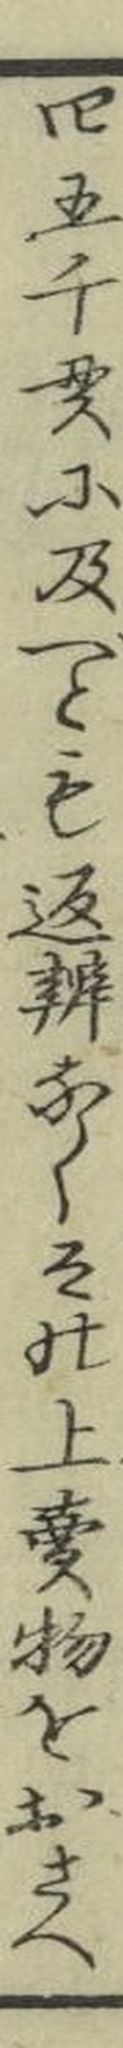四五千貫に及べとも返弁なく、その上売物をおさへ
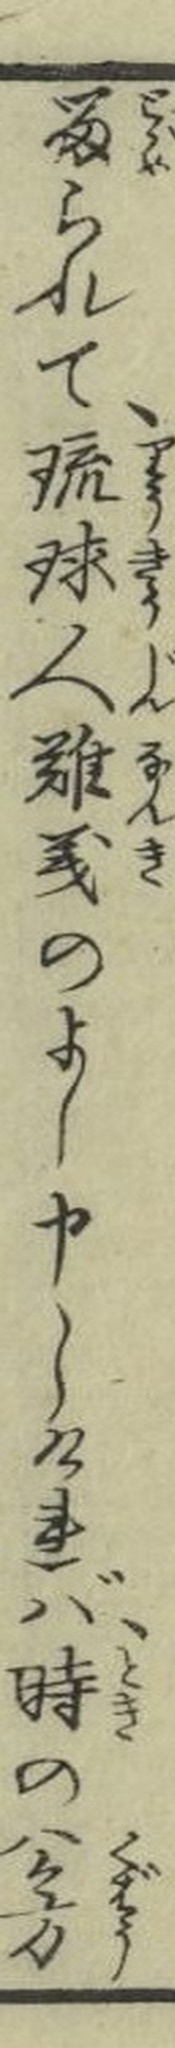留られて、琉球人難義のよし申しければ、時の公方
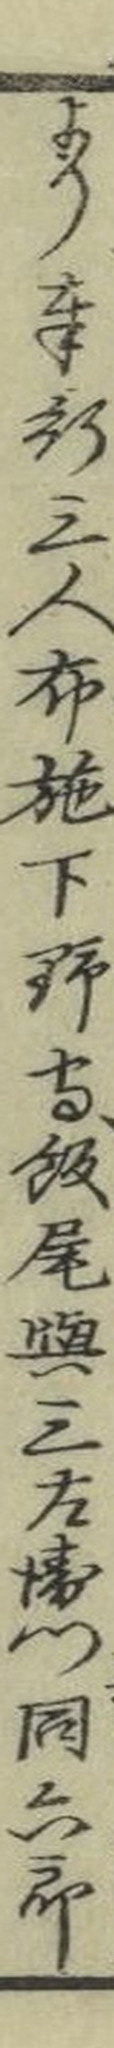より、奉行三人、布施下野守、飯尾与三左衛門、同六郎

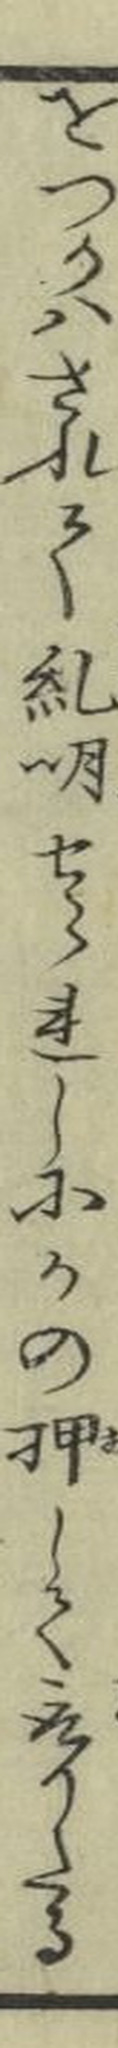をつかはされて、糺明せられしにかの押して取りたる
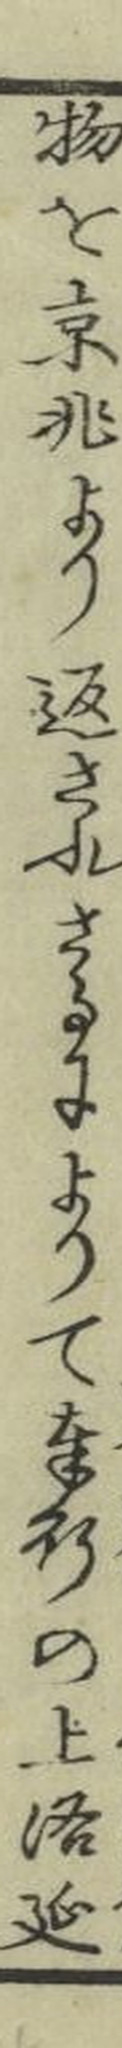物を京兆より返されさるによりて、奉行の上洛延
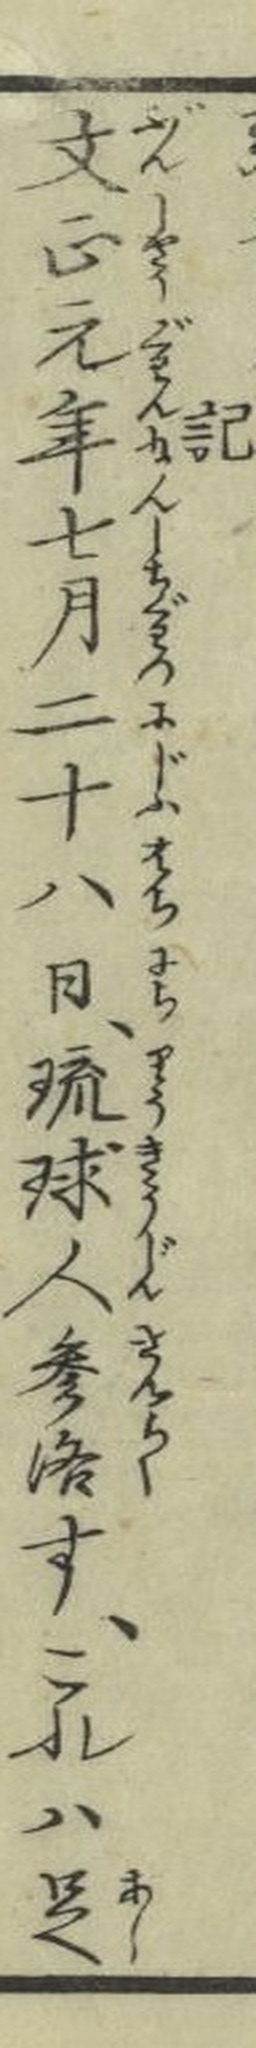文正元年七月二十八日、琉球人参洛す、これは足
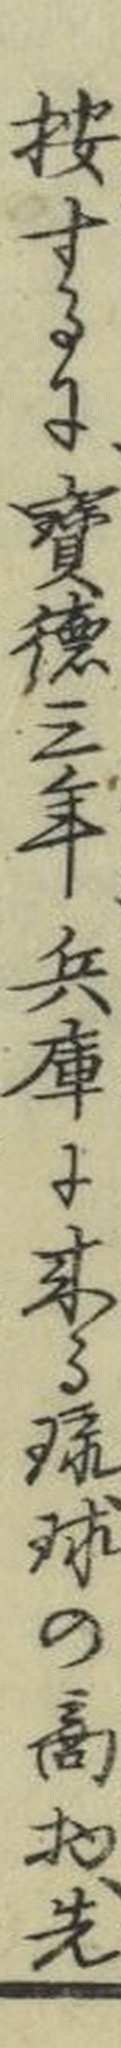按ずるに、宝徳三年、兵庫に来る琉球の商物、先
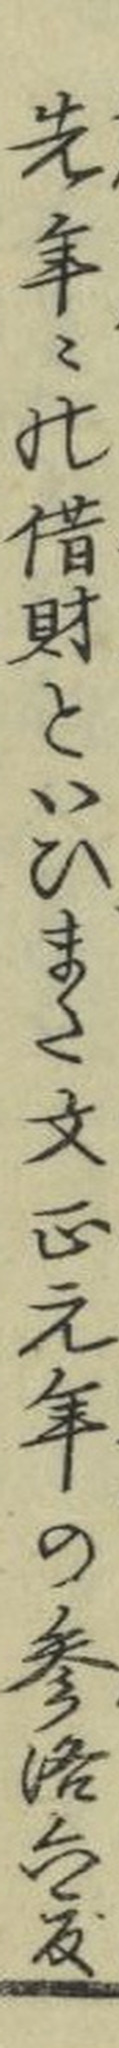先年々の借財といひ、また文正元年の参洛六度
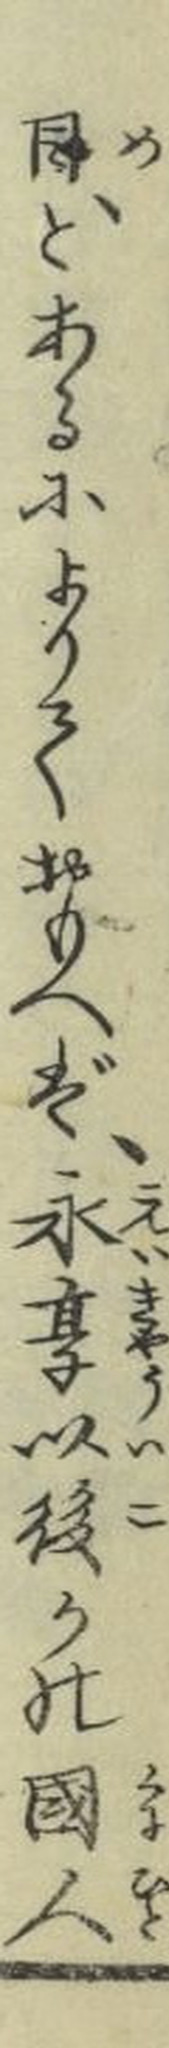目、とあるによりておもへば、永享以後かの国人
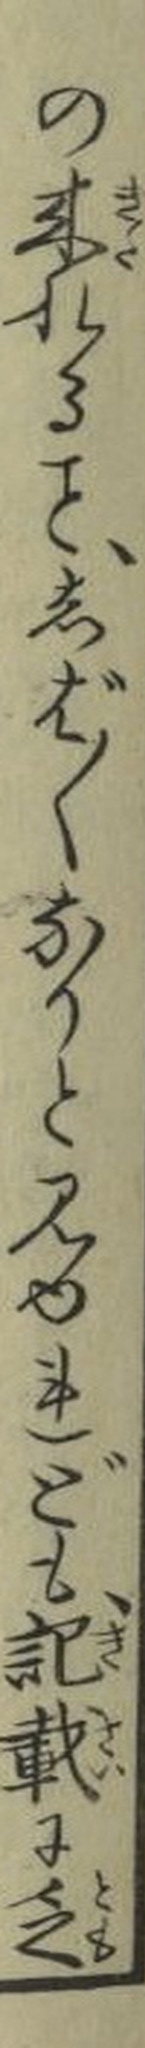の来れること、しば〳〵なりと見ゆれども、記載に乏
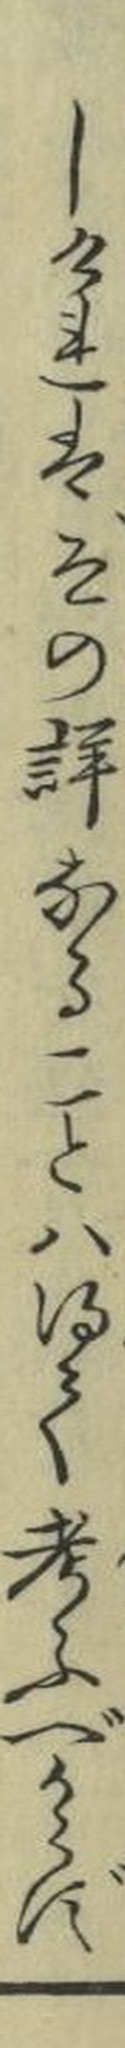しければ、その詳なることは得て考ふべからず
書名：琉球入貢紀略
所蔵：University of the Ryukyus Library
